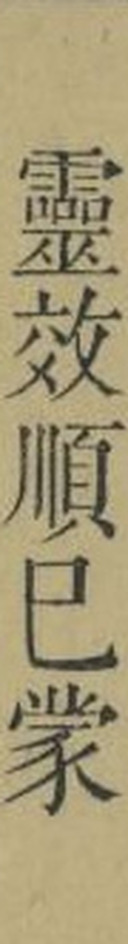靈效順巳蒙
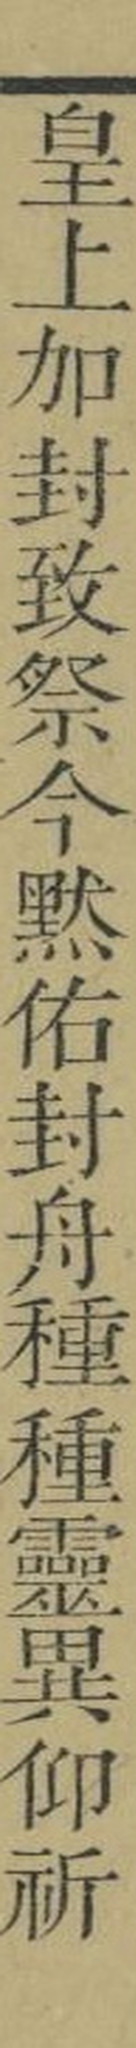皇上加封致祭今默佑封舟種種靈異仰祈
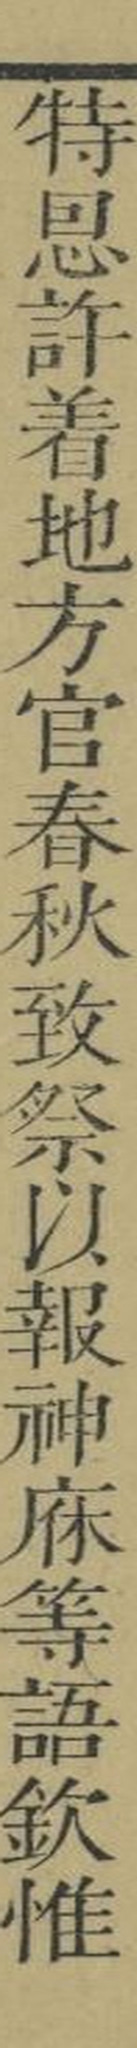特㤙許着地方官春秋致祭以報神庥等語欽惟
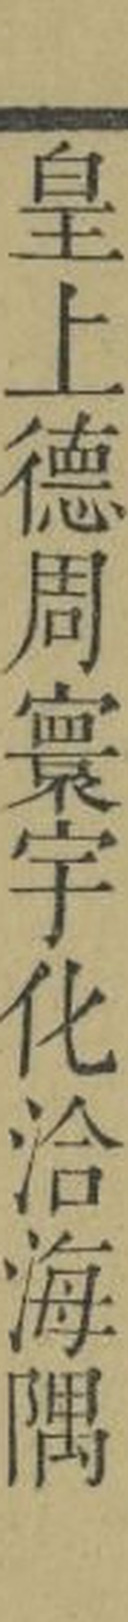皇上德周寰宇化洽海隅
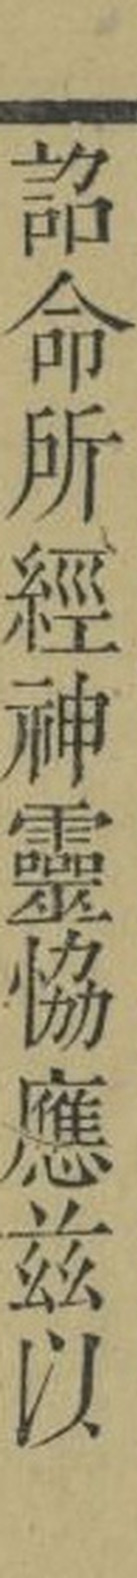詔命所經神靈恊應茲以
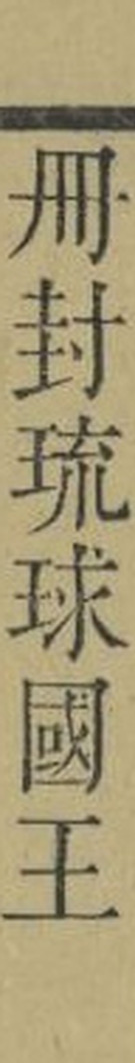冊封琉球國王
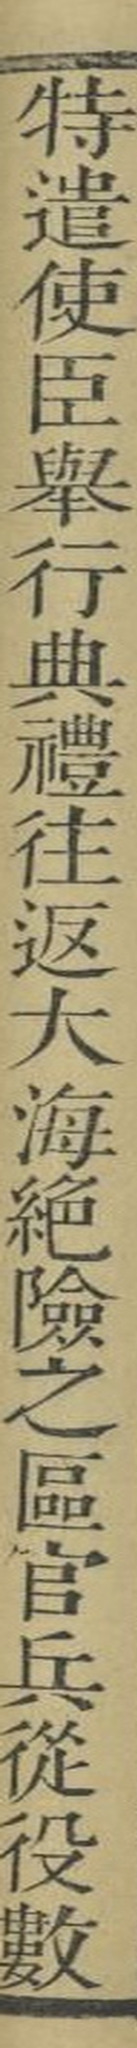特遣使臣舉行典禮往返大海絶險之區官兵從役數
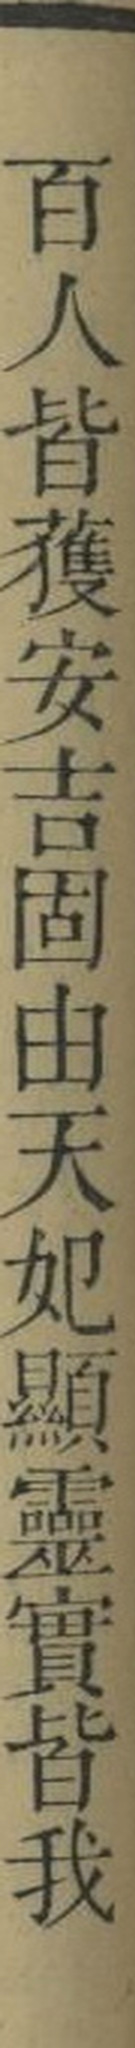百人皆獲安吉固由天妃顯靈實皆我
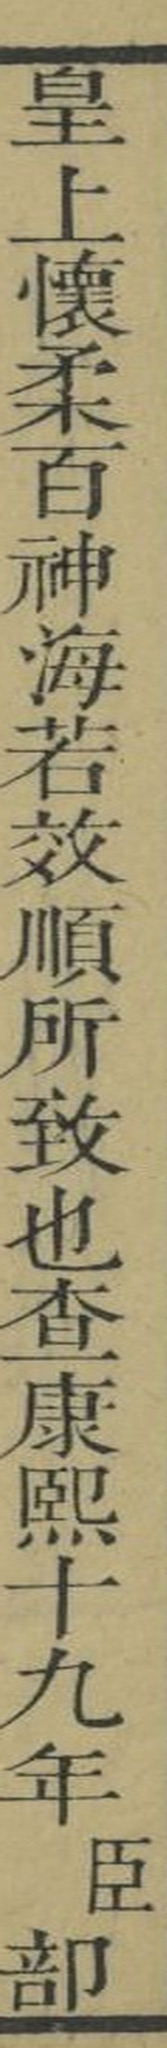皇上懷柔百神海若效順所致也查康熙十九年臣部
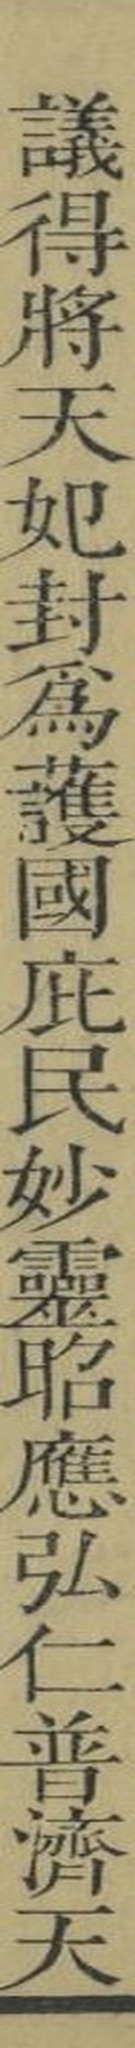議得將天妃封爲䕶國庇民妙靈昭應弘仁普濟天
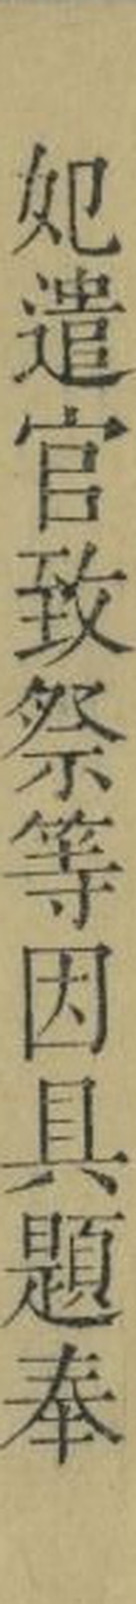妃遣官致祭等因具題奉
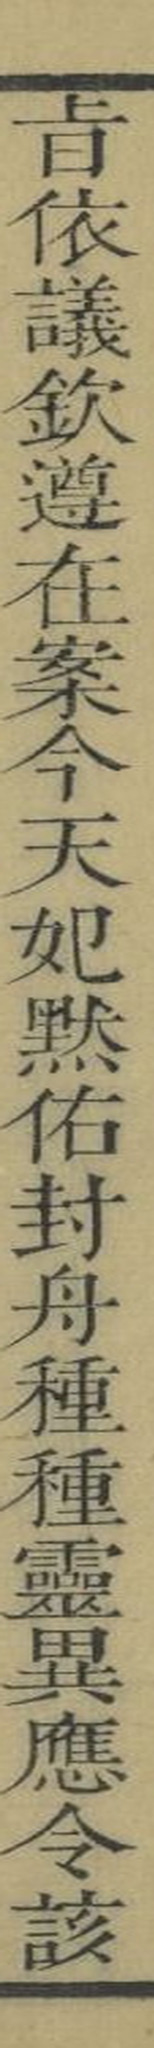㫖依議欽遵在案今天妃默佑封舟種種靈異應令該
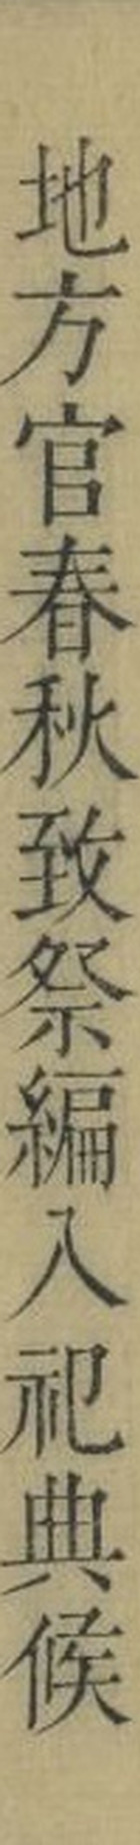地方官春秋致祭編入祀典候
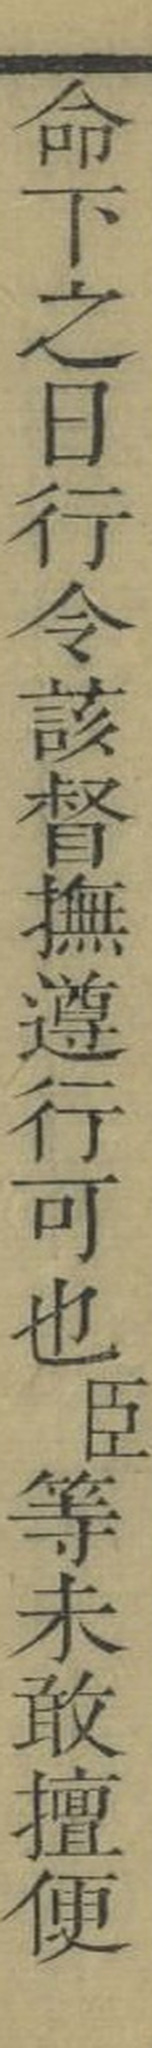命下之日行令該督撫遵行可也臣等未敢擅便
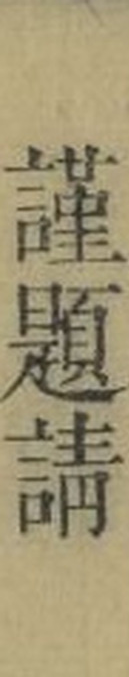謹題請
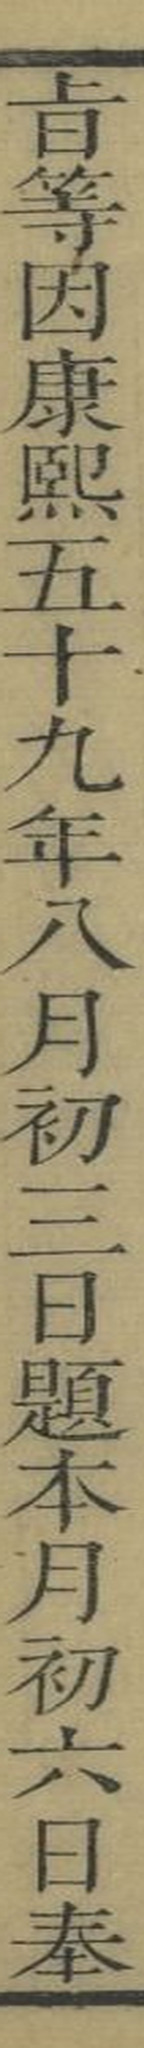㫖等因康熙五十九年八月初三日題本月初六日奉
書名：中山伝信録 巻一
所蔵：University of the Ryukyus Library
